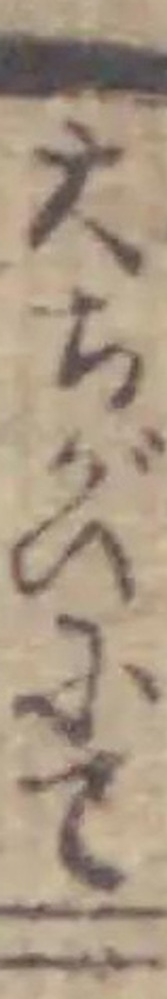大ちがいにて
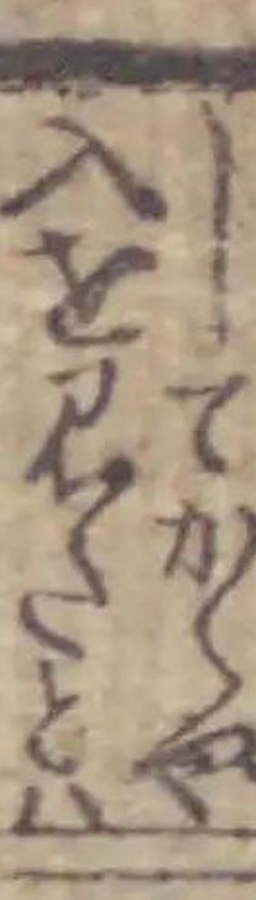入を見たとは
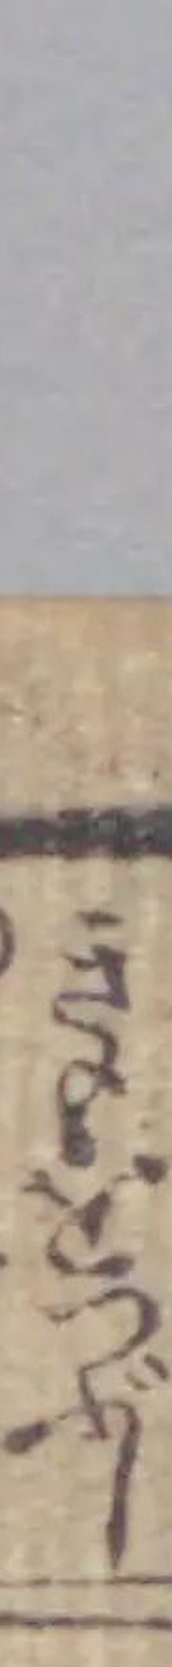きもをつぶし
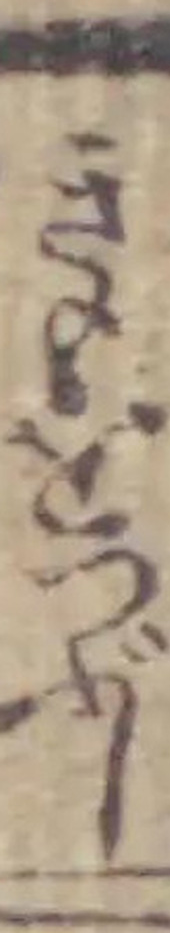きもをつぶし
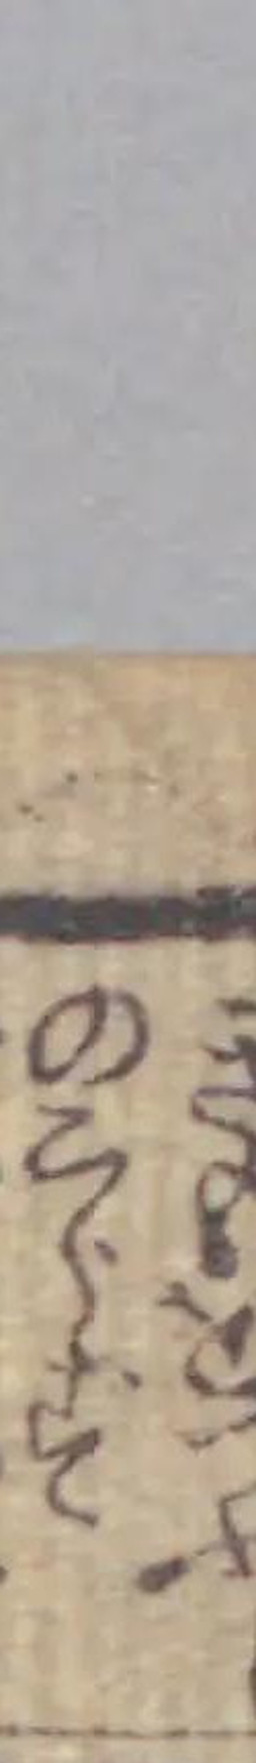のこらず
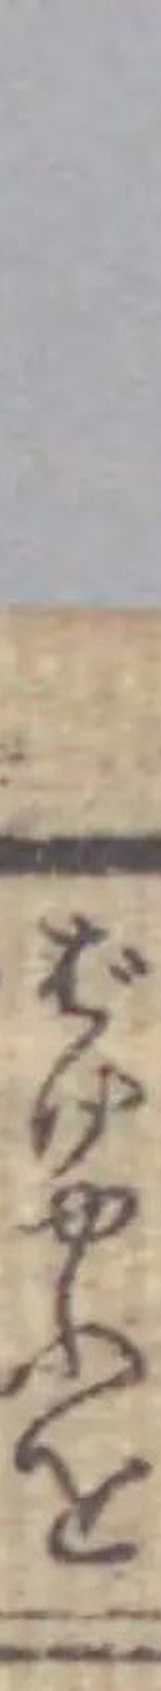ばけやふを
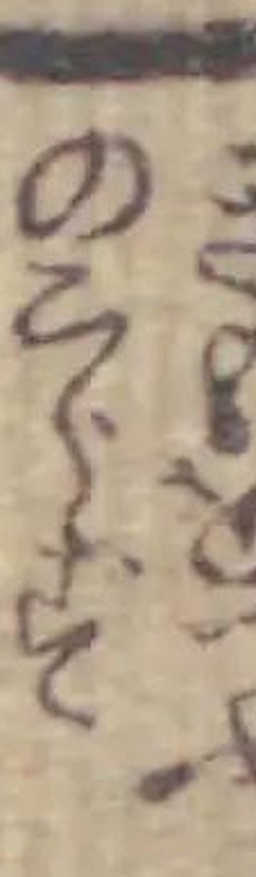のこらず
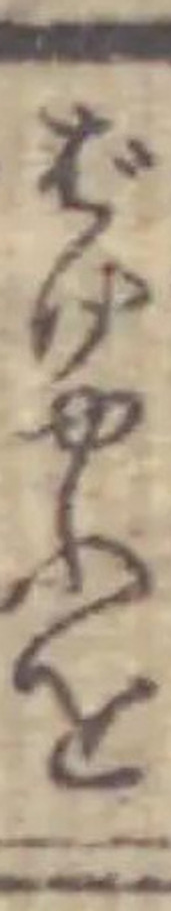ばけやふを
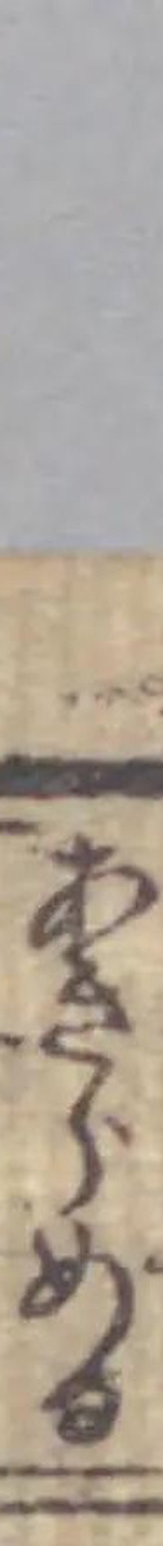あきらめる
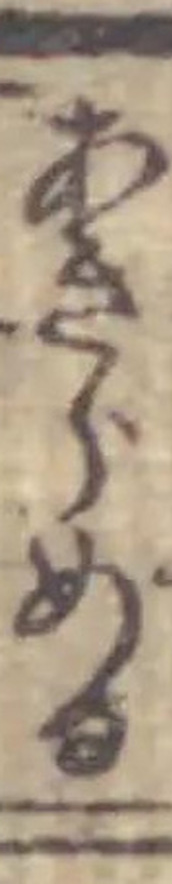あきらめる
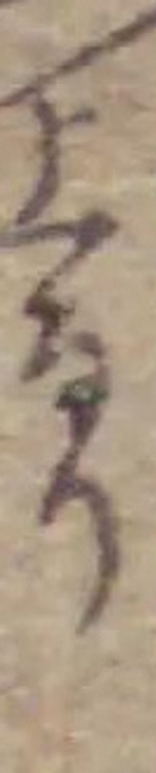上なり
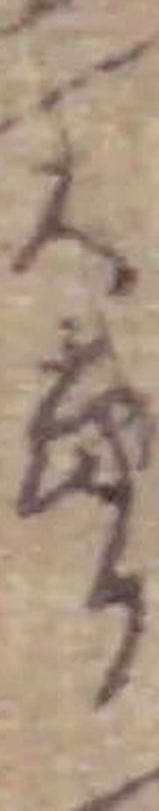上なり

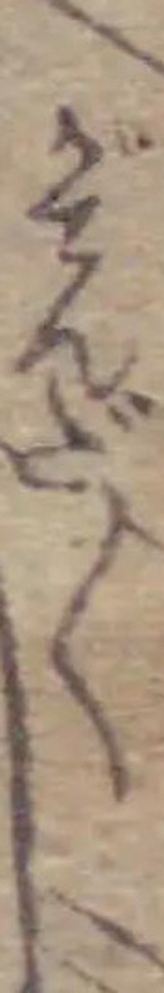がてんだ〳〵
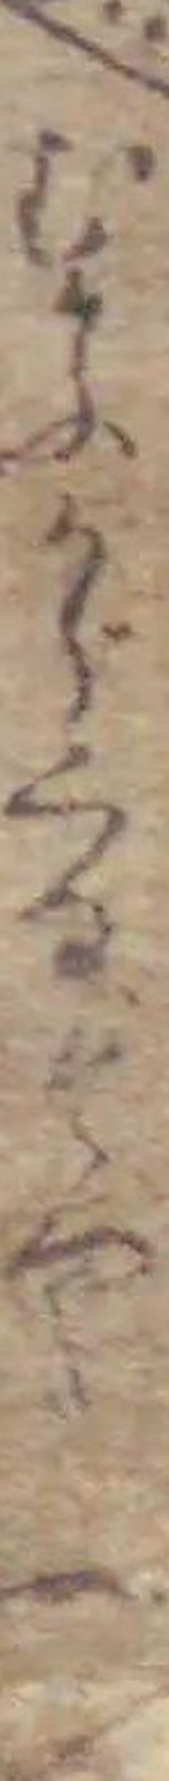むかふからくるや
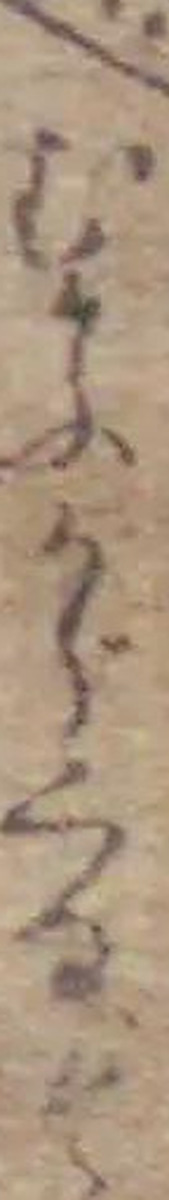むかふからくるや
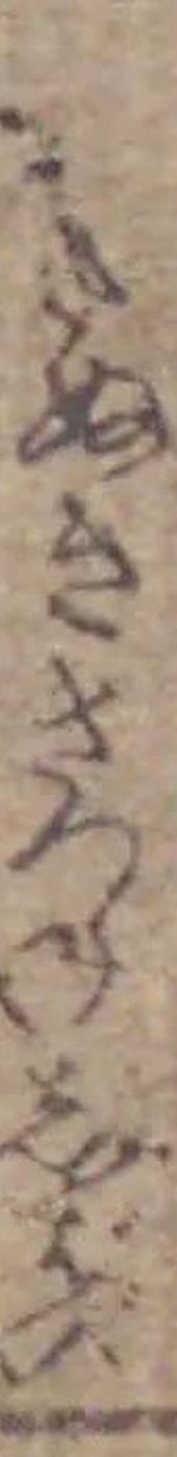たぬききつねしはい
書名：化物箱根先 2巻
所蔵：国立国会図書館 National Diet Library, JAPAN
